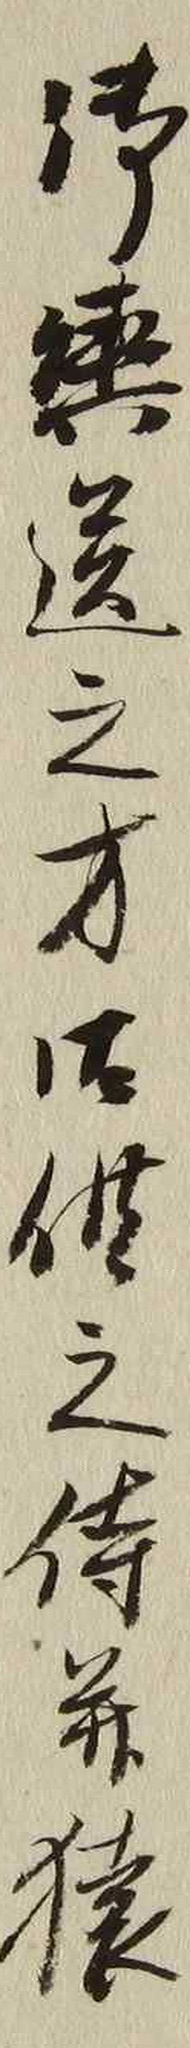御輿送之方御供之侍并猿
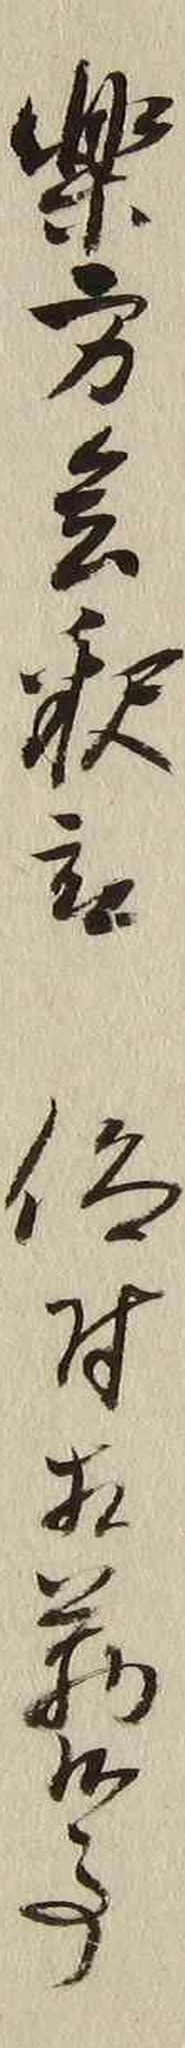楽方会釈被仰付相勤候事
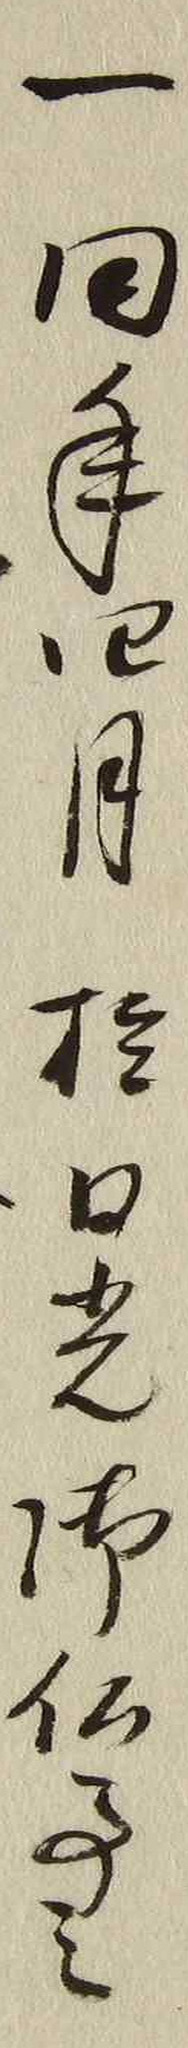一同年四月於日光御仏事之
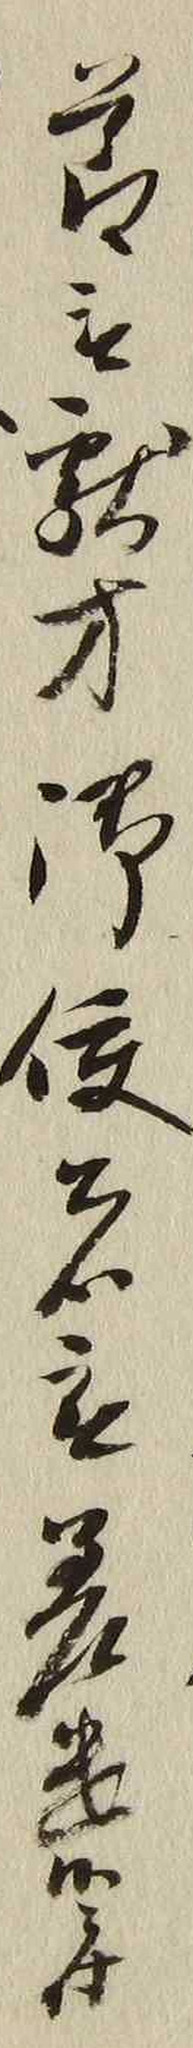節被献方御使者被差遣候ニ付
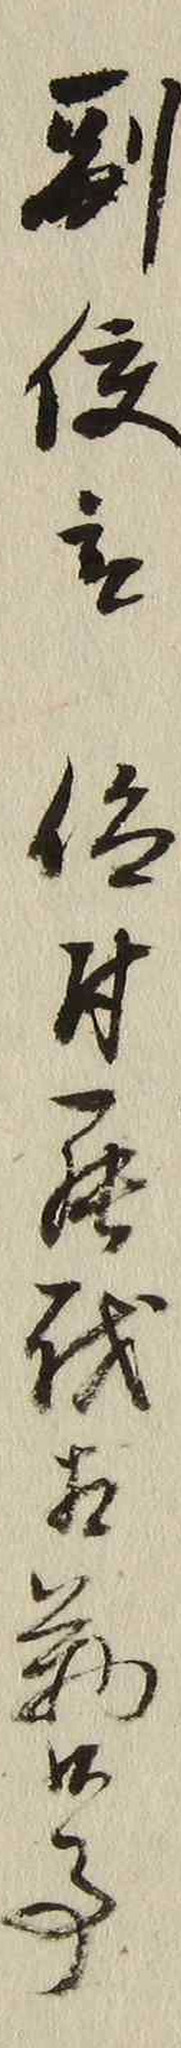副使被仰付罷越相勤候事
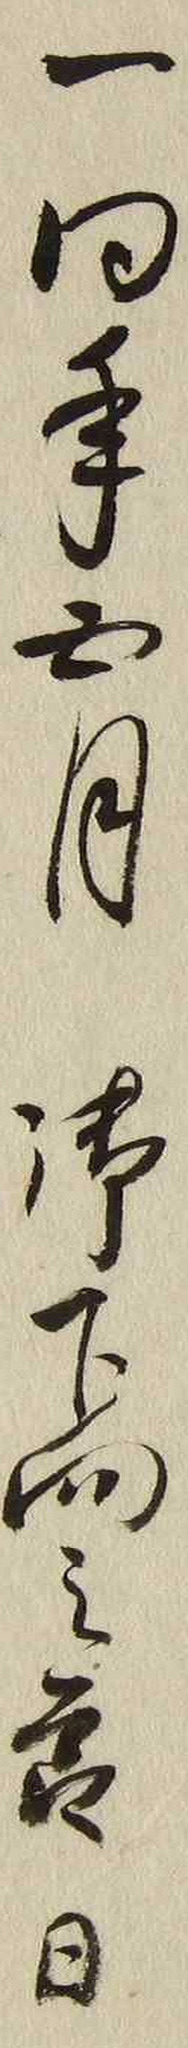一同年正月御下向之節日
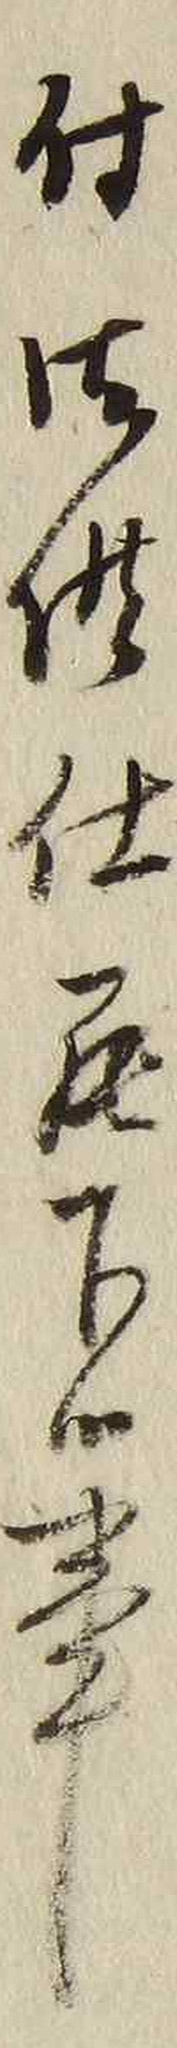付御供仕罷下候事
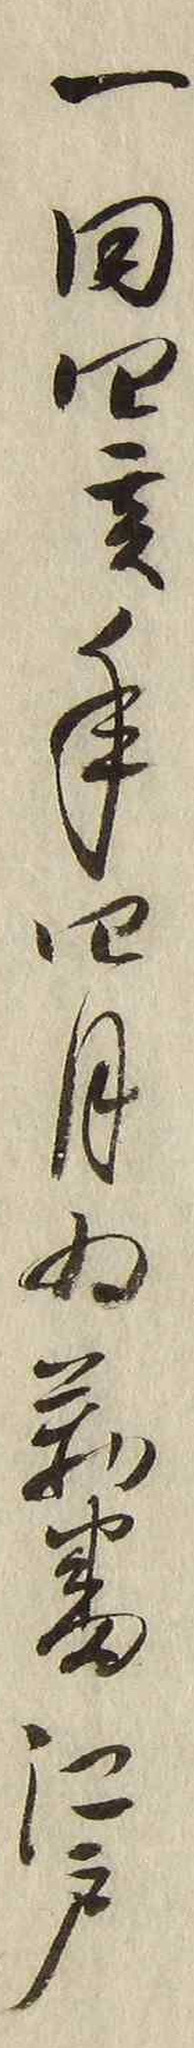一同四亥年四月為勤番江戸

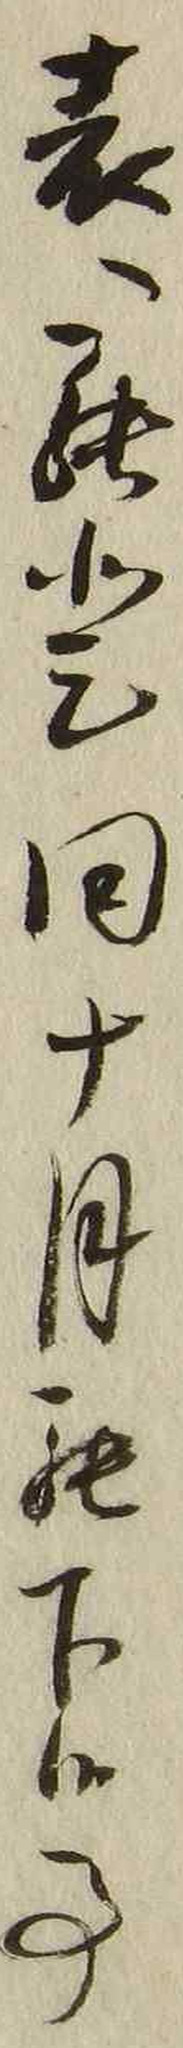表へ罷登同十月罷下候事
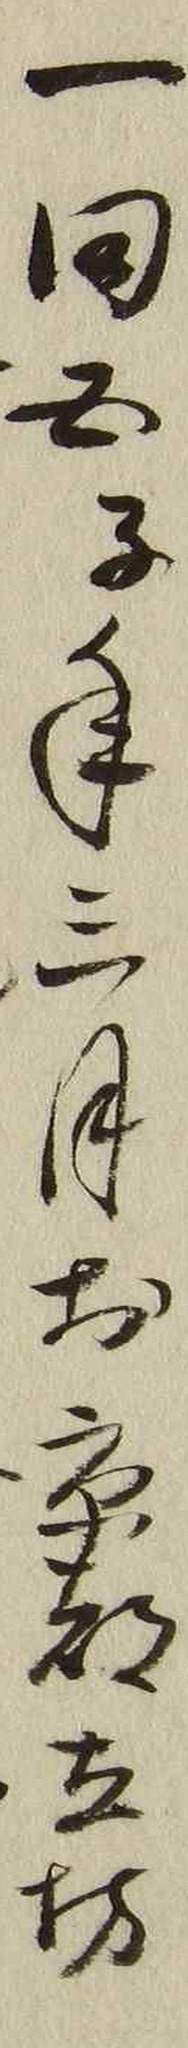一同五子年三月於京都立坊
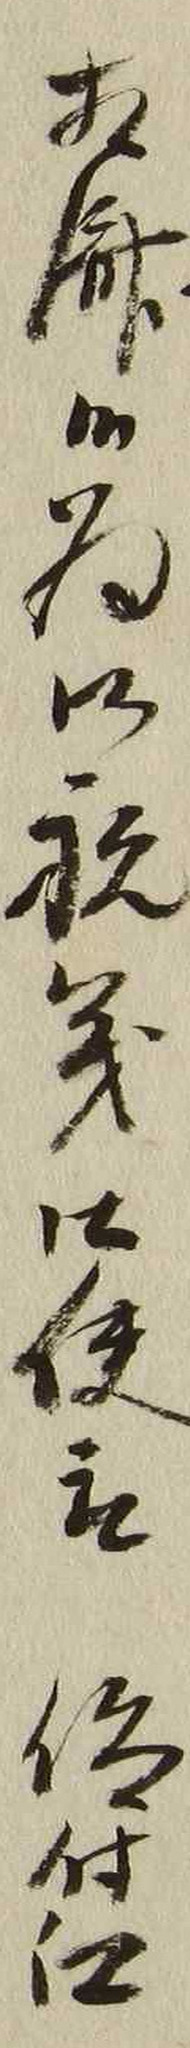相済候為御祝義御使被仰付江
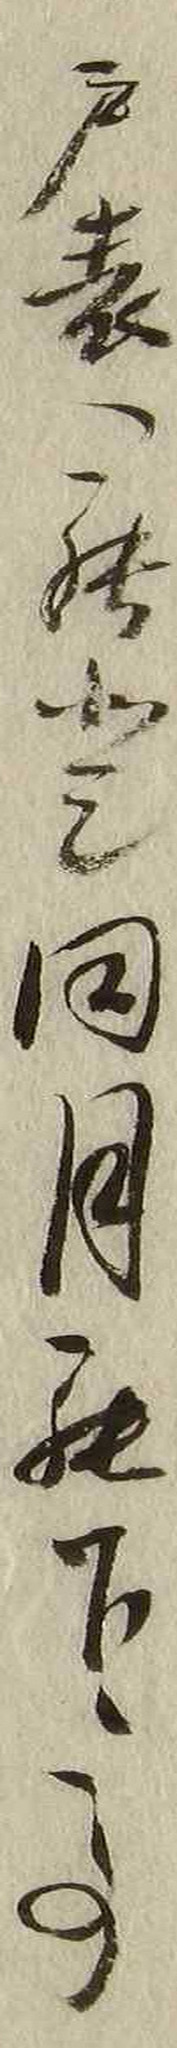戸表へ罷登同月罷下候事
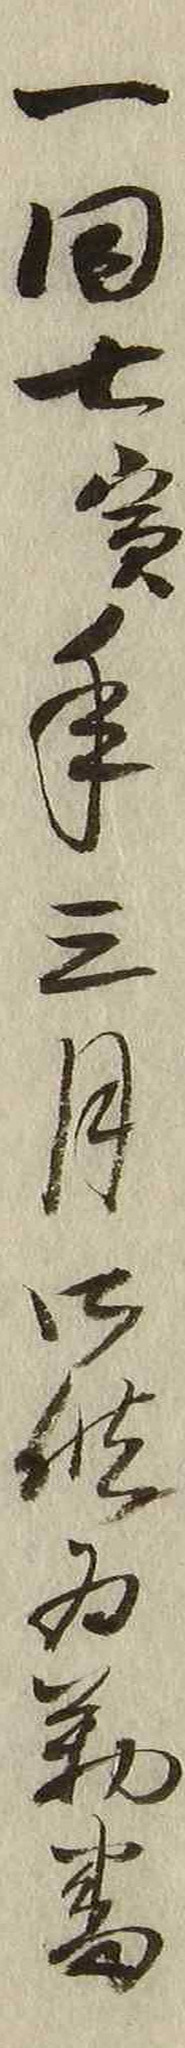一同七寅年三月御供為勤番
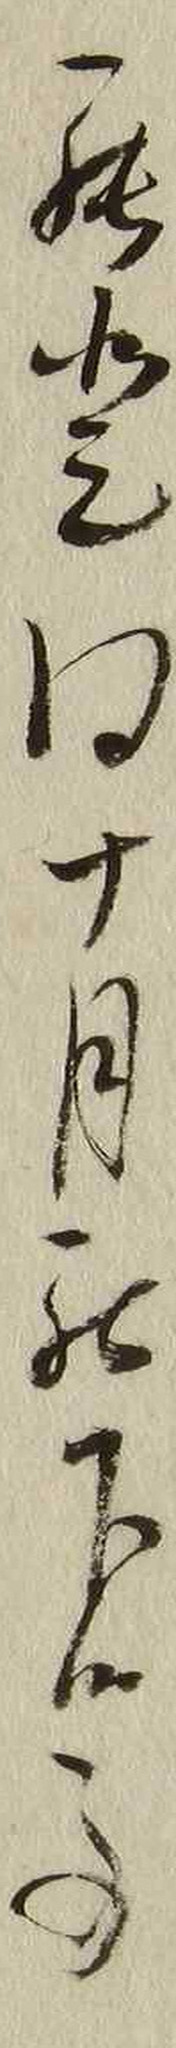罷登同十月罷下候事
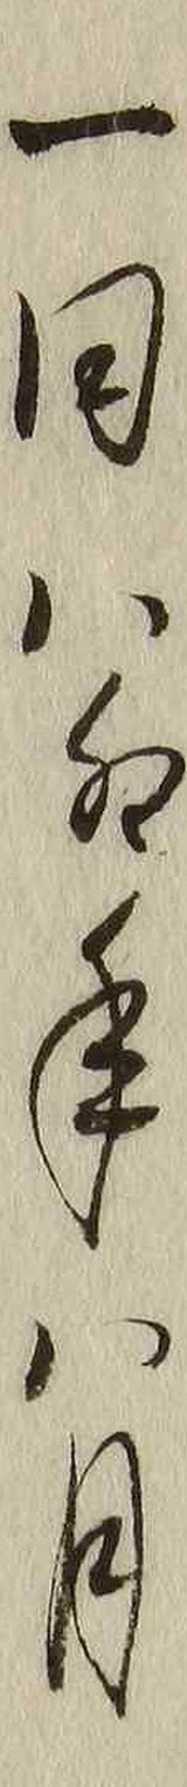一同八卯年八月
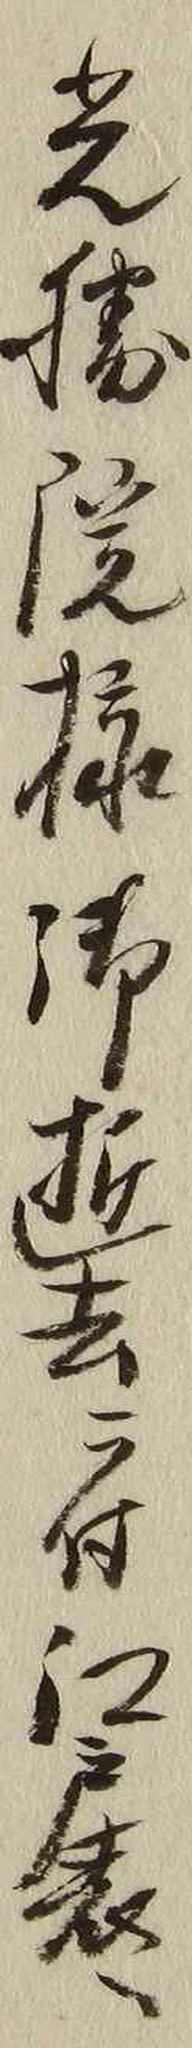光勝院様御逝去ニ付江戸表へ
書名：諸士系譜　巻之355　す之部5
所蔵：会津若松市立会津図書館
